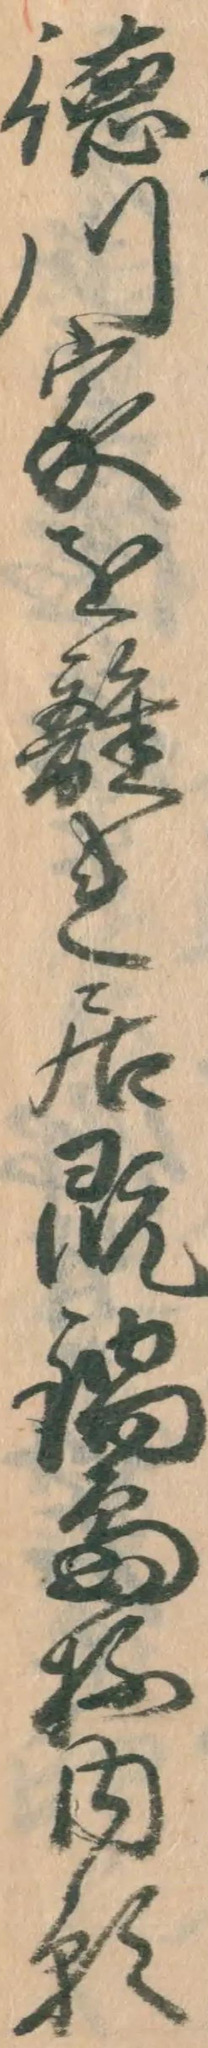徳川家を離れ居既鍋嶋様内願

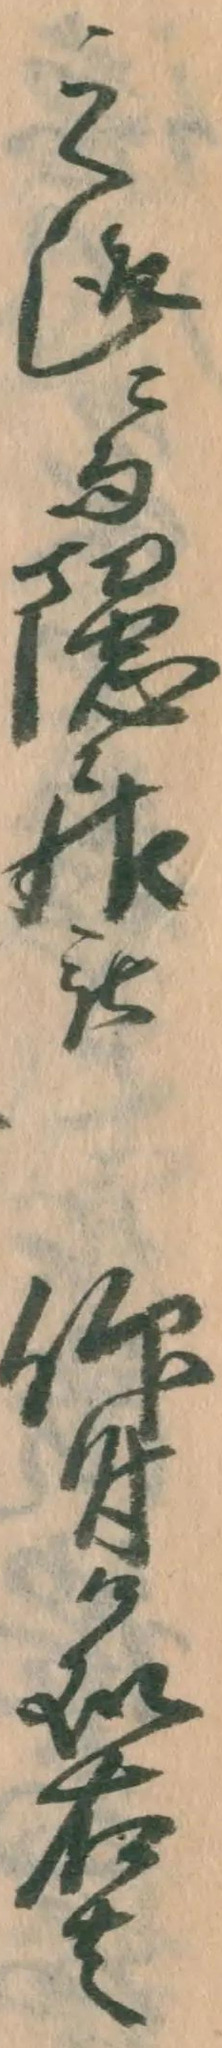之趣ニ而隠居被仰付候処右者
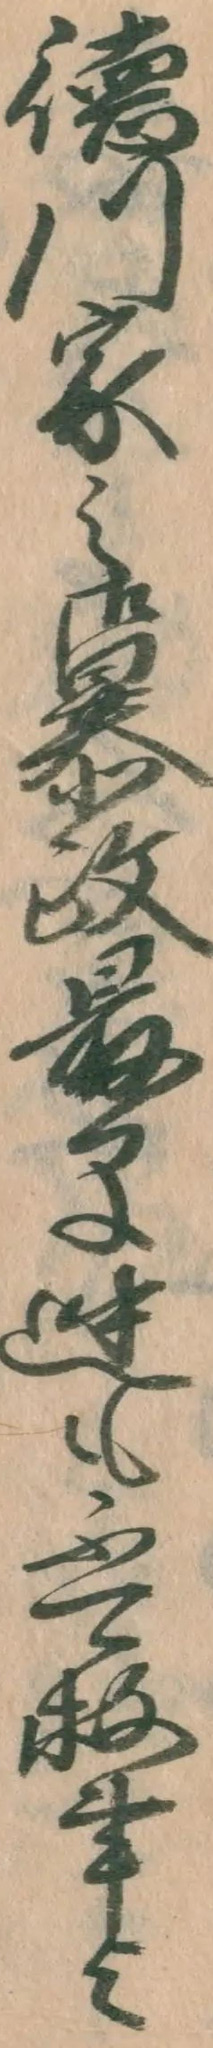徳川家之御暴政最早迚も不可救事と
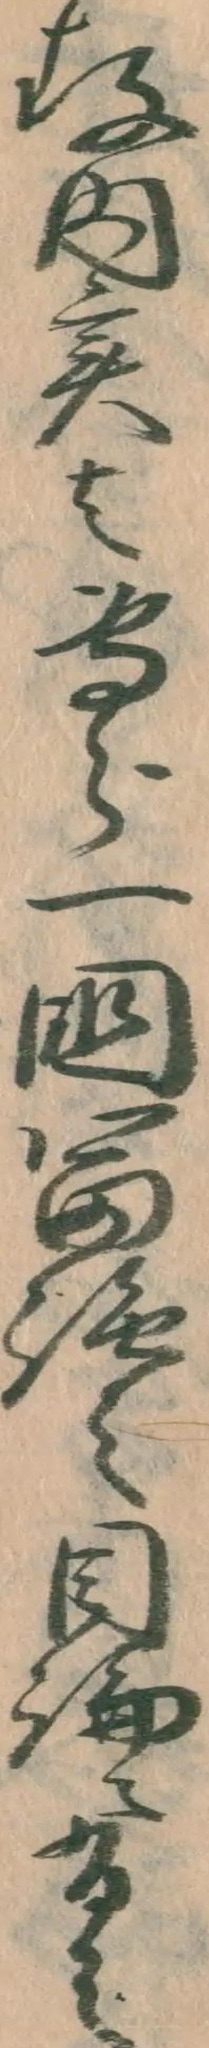存内実者専ら一国富強之目論ニ有之
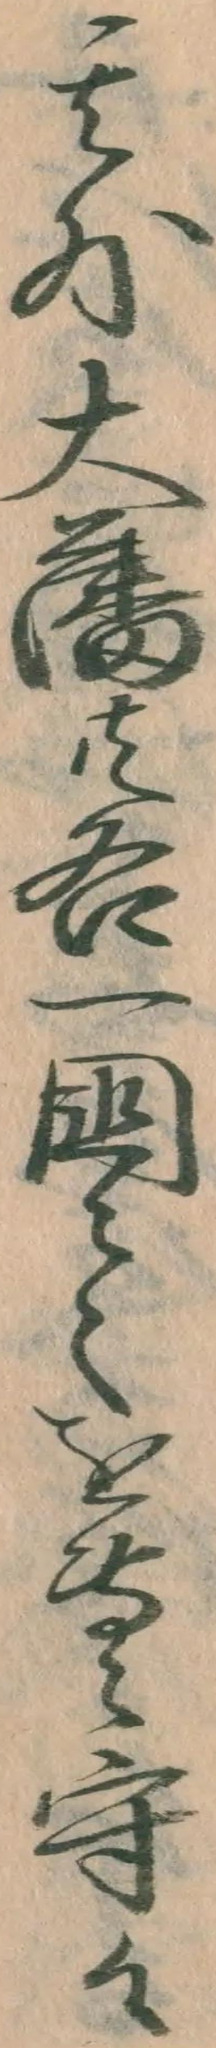其外大藩共各一国々々を専ニ守候て
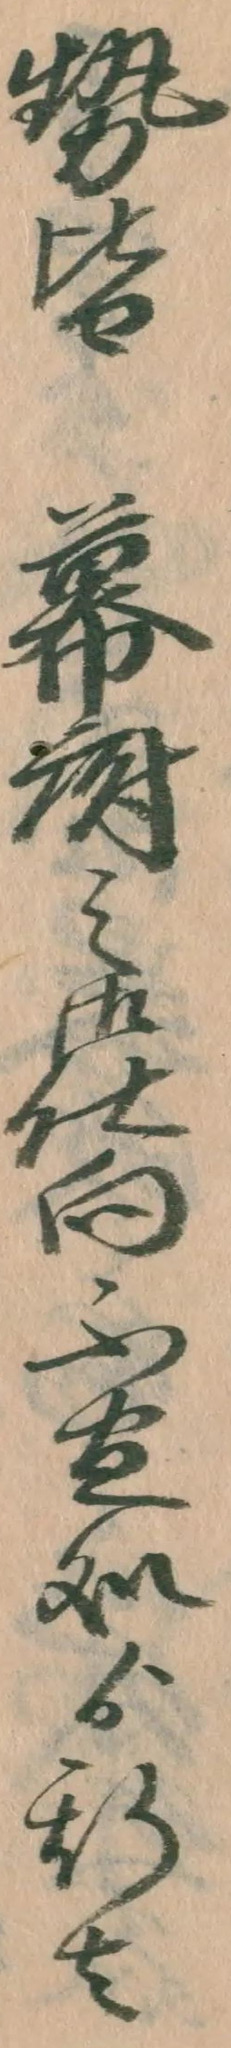勢皆幕府之御仕向不宜処より斯者
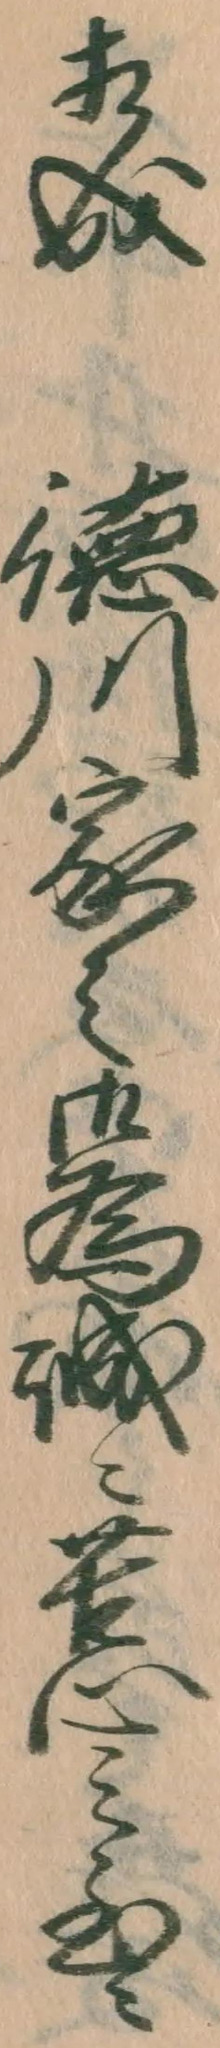相成徳川家之御為誠ニ苦心之至ニ
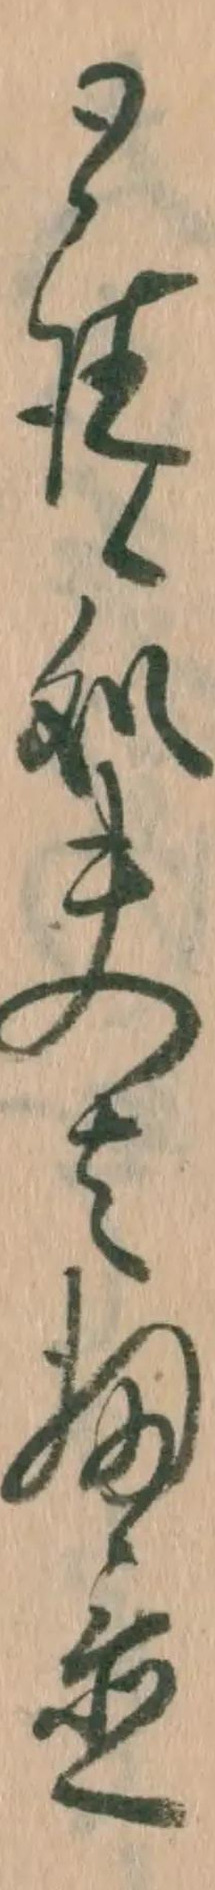御座候処夫者扠置
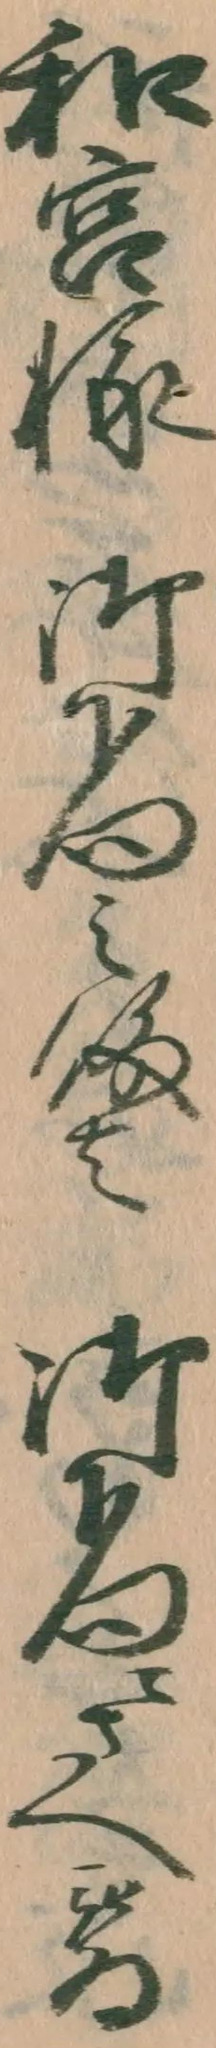和宮様御下向之儀者御下向ニさへ被為
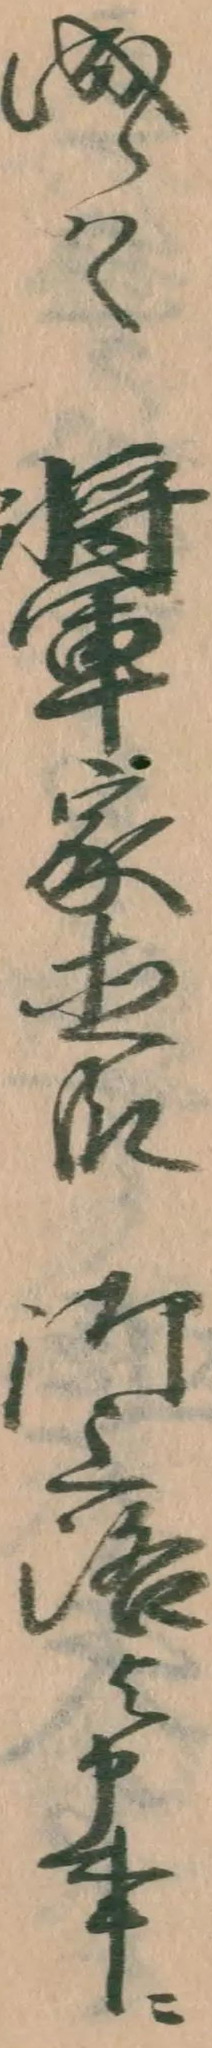成候ハゝ将軍家直様御上洛と申事ニ
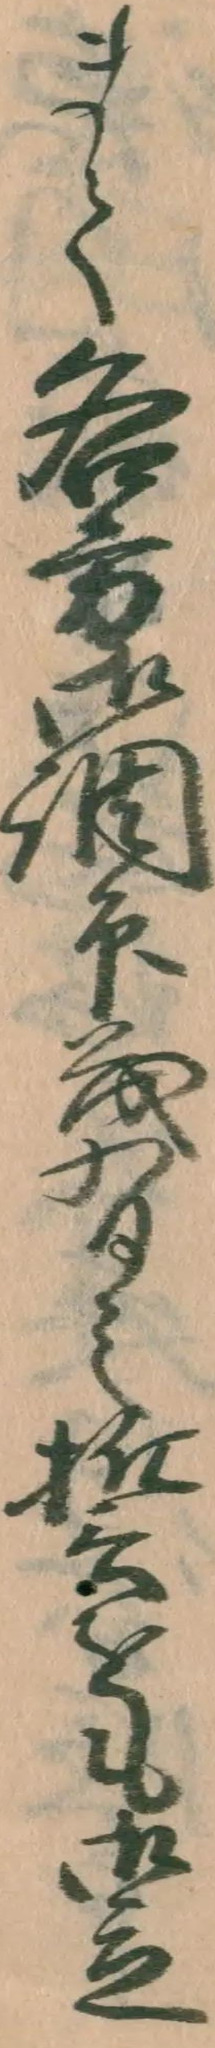まて各方御調印も有之誓をも御立
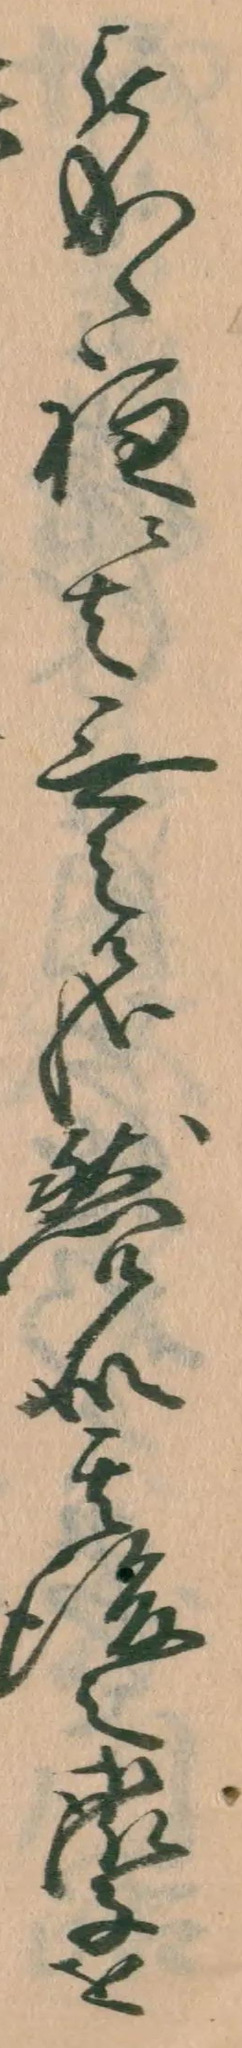被成候程ニ者無之候哉然ル処其後之御様子を
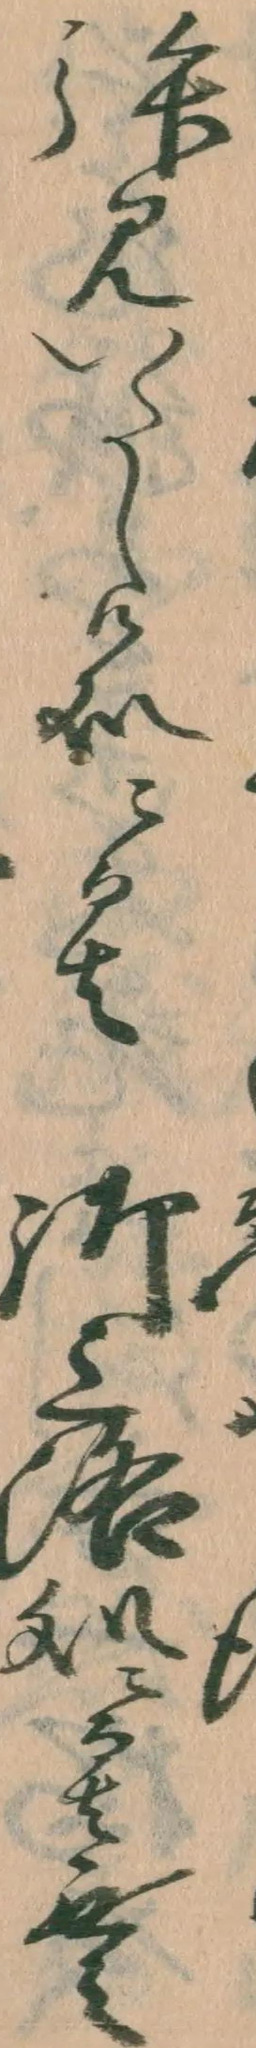拝見いたし候処二而者御上洛処ニ而者無之
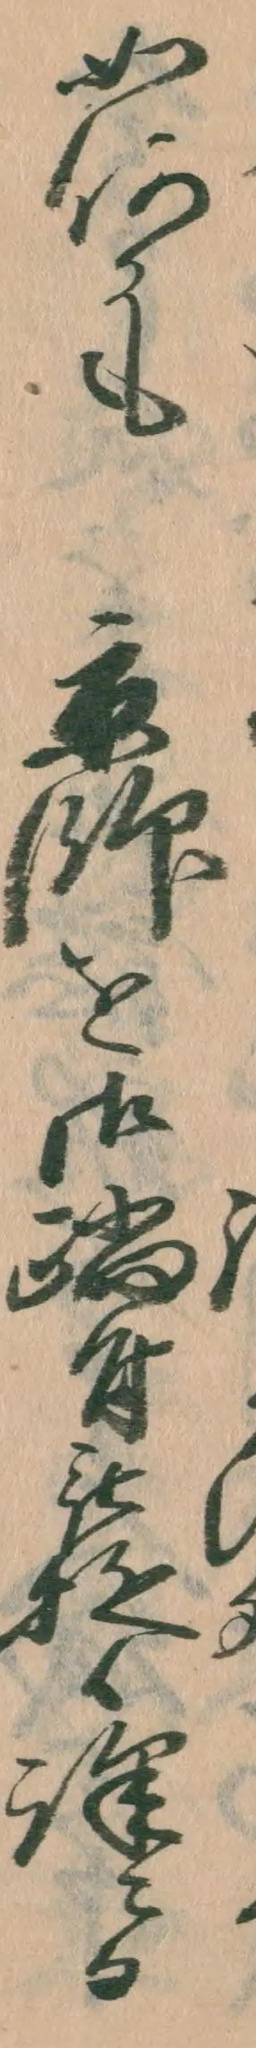如何にも京師を御踏付被遊候譯ニ而
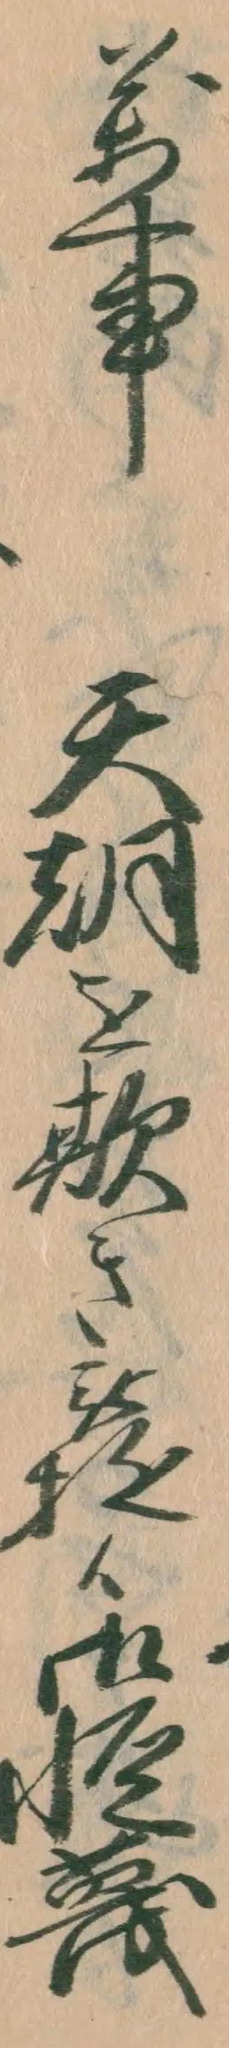萬事天朝を欺き被遊候御軽蔑
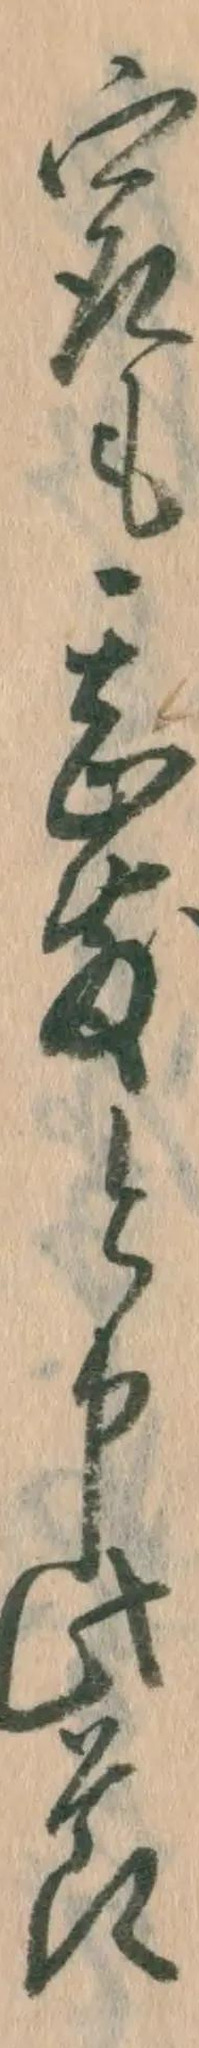最も甚敷と申此節
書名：麗斎叢書. 20
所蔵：国立国会図書館 National Diet Library, JAPAN
